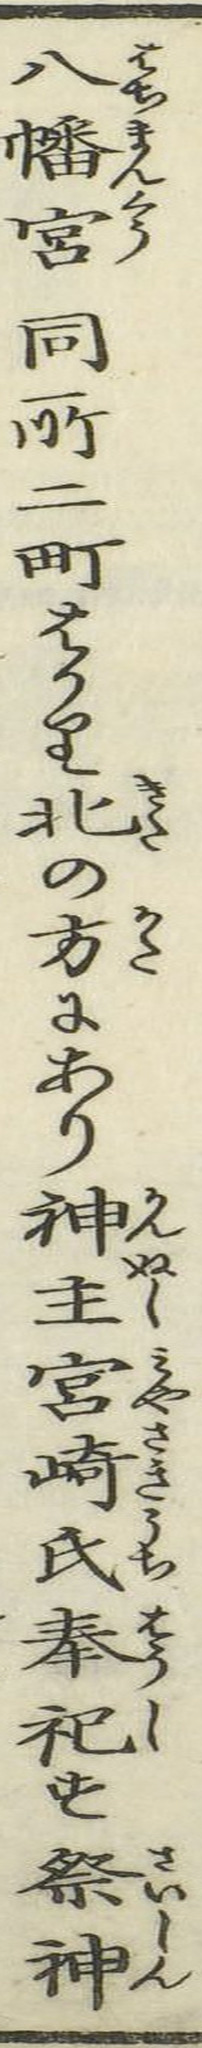八幡宮同所二町はかり北の方にあり神主宮崎氏奉祀す祭神
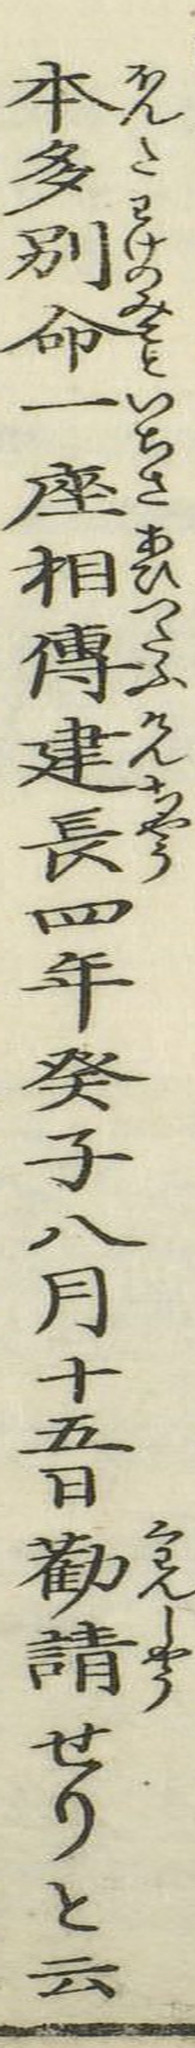本多別命一座相伝建長四年癸子八月十五日勧請せりと云
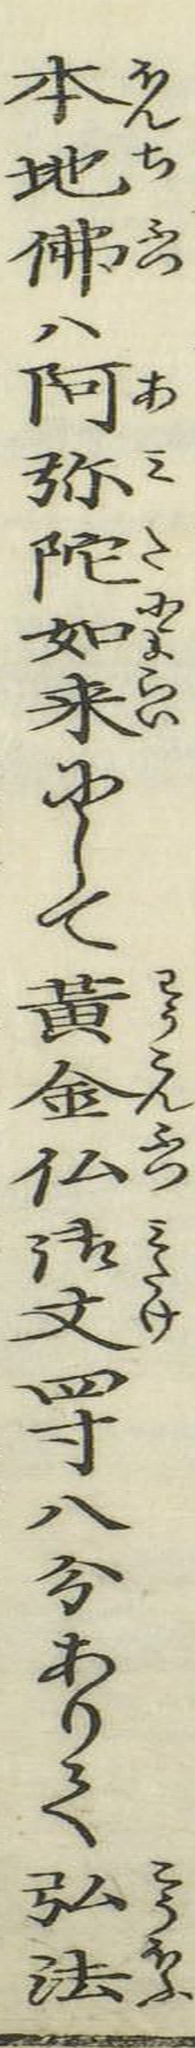本地佛は阿弥陀如来にして黄金佛御丈四寸八分ありて弘法
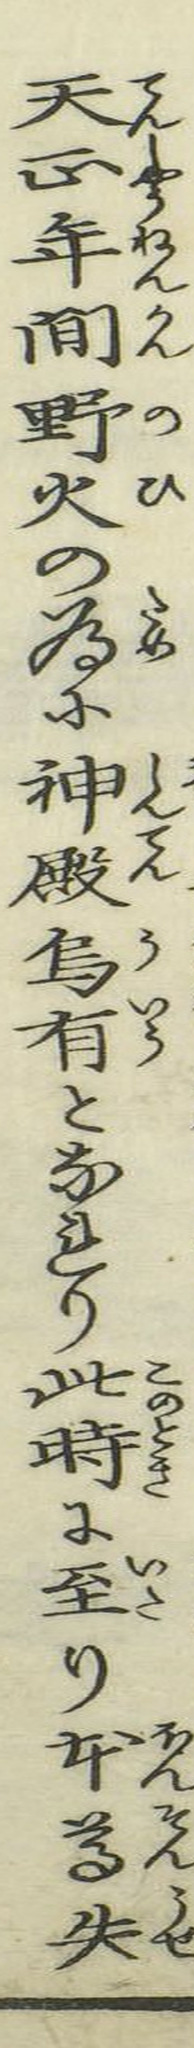天正年間野火の為に神殿烏有となれり此時に至り本尊失

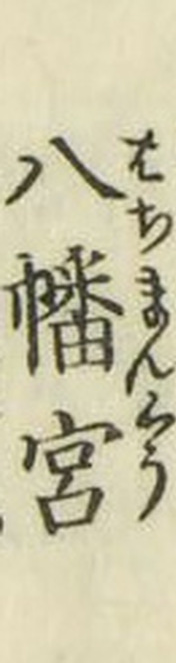八幡宮
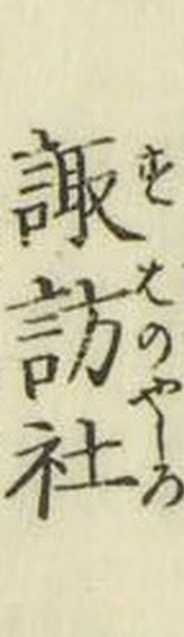諏訪社
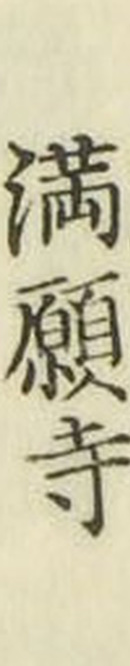満願寺
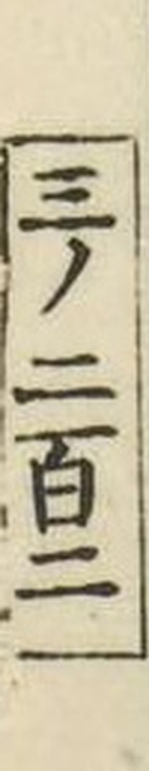三ノ二百二

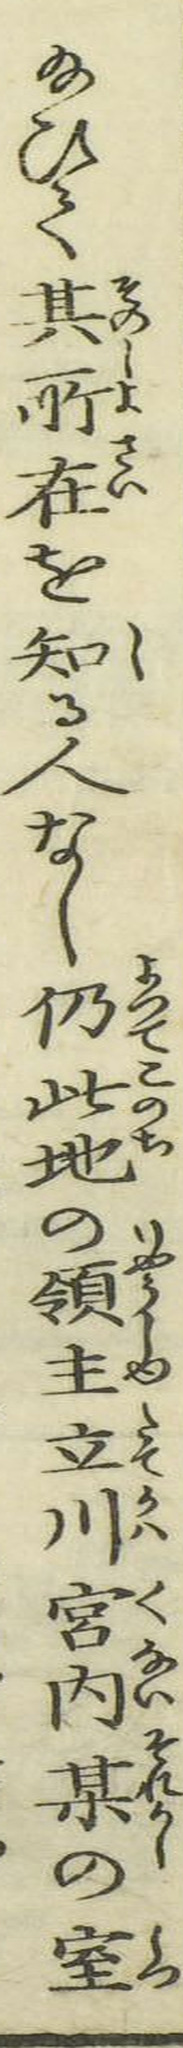給ひて其所在を知る人なし仍此地の領主立川宮内某の室
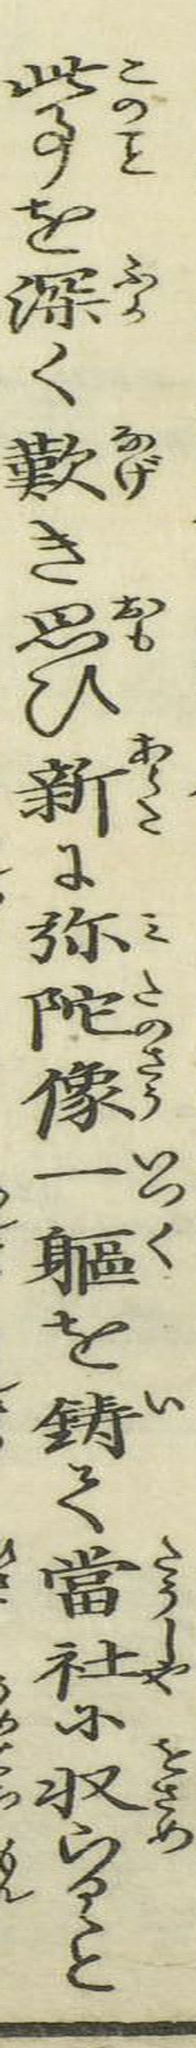此事を深く歎き思ひ新に弥陀像一躯を鋳て當社に収らるゝと
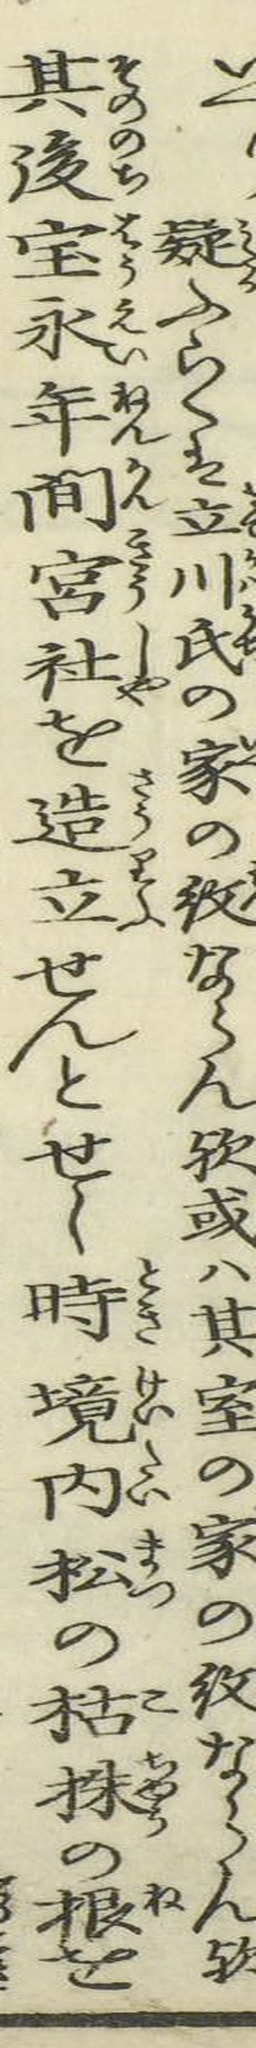其後宝永年間宮社を造立せんとせし時境内松の枯株の根を
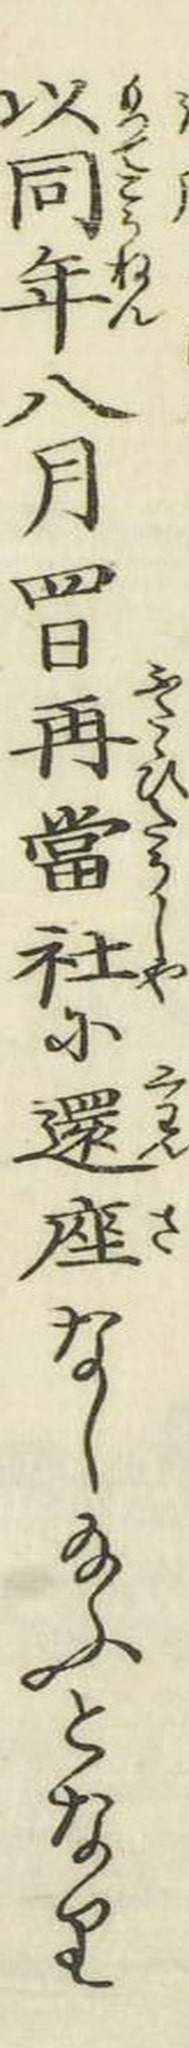以同年八月四日再当社に還座なし給ふとな
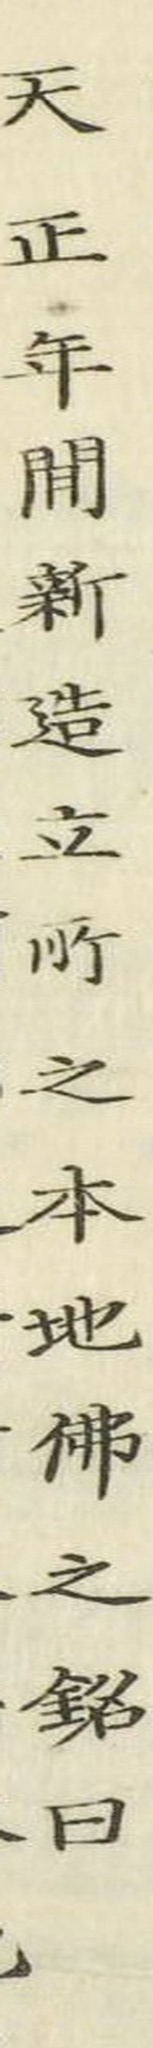天正年間新造立所之本地佛之銘曰
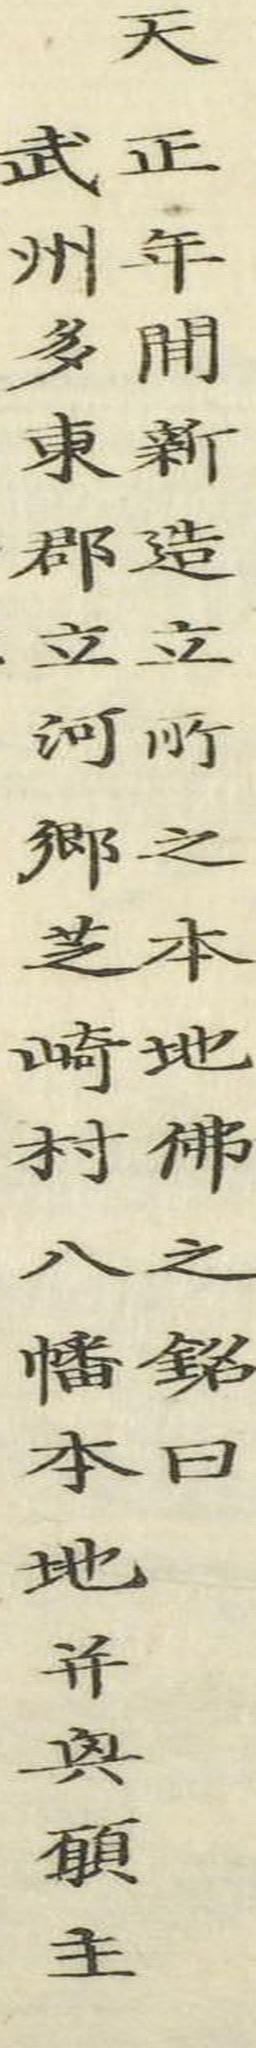武州多東郡立河郷芝崎村八幡本地并興願主
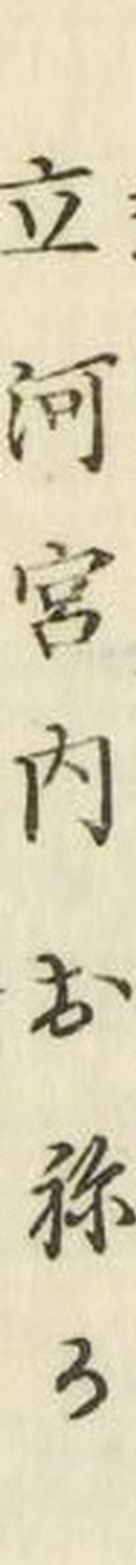立河宮内お称か
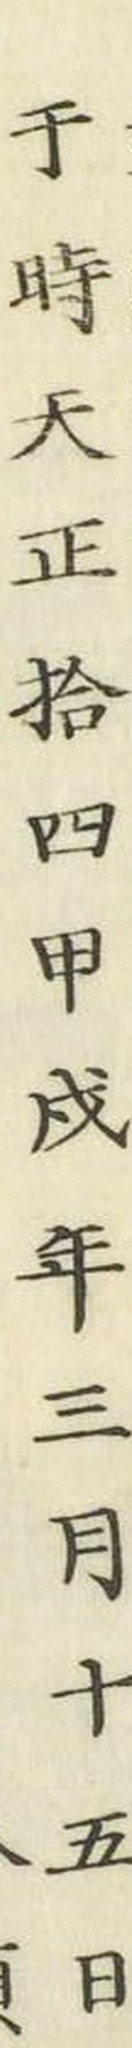干時天正拾四甲戌年三月十五日
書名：江戸名所図会 20巻 巻之10
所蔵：東京学芸大学教育コンテンツアーカイブ
